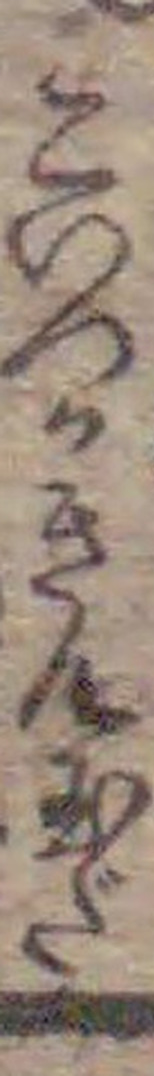こいつかきん玉だ
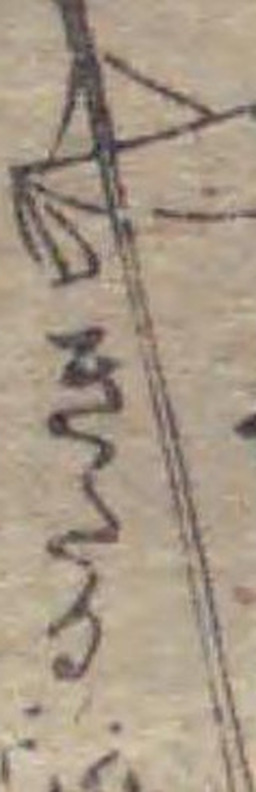きたる
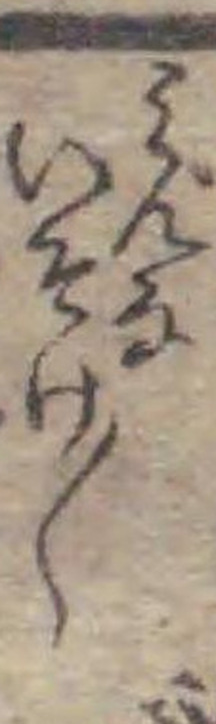いそけ〳〵
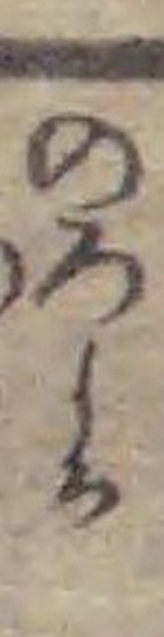のろしか
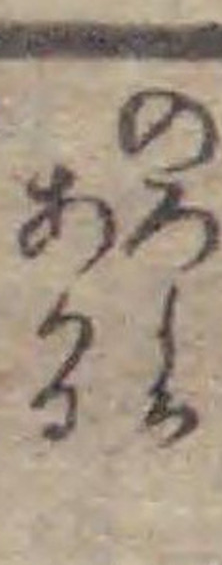あかる
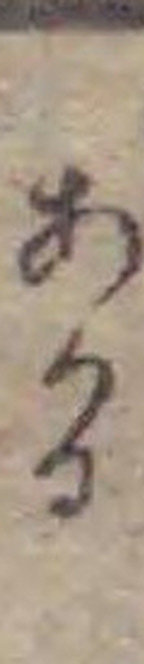あかる
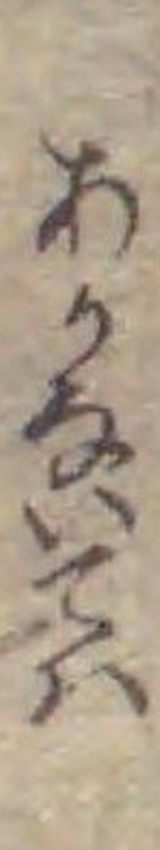あかないては
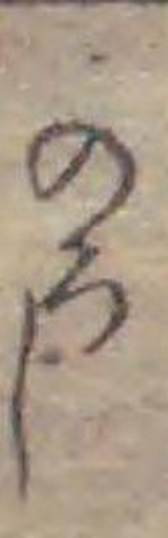のろし

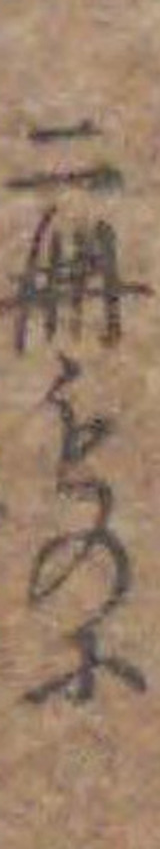二冊ものに
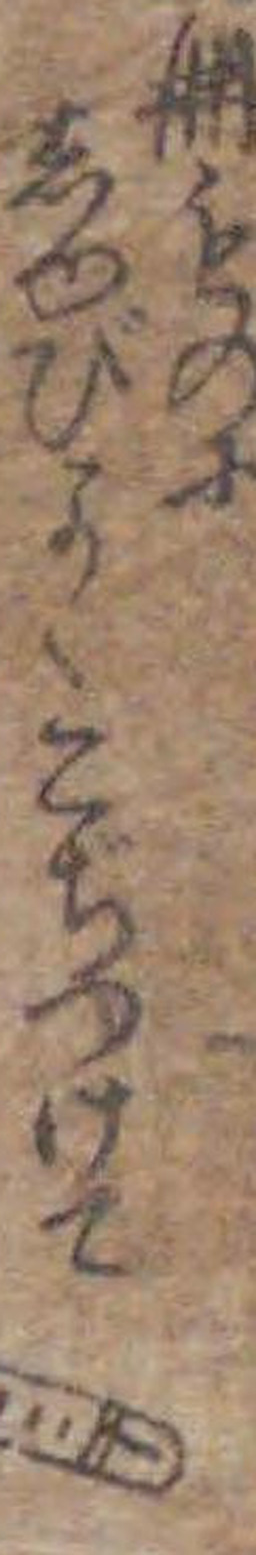しゆびよくこぢつけて
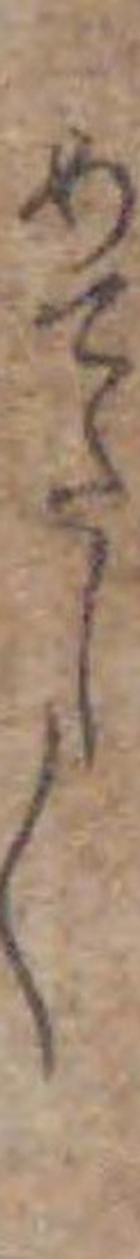めてたし〳〵
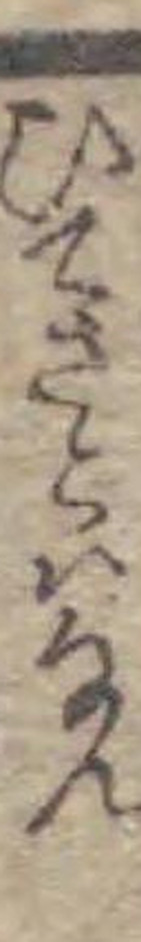ひてさとはなん
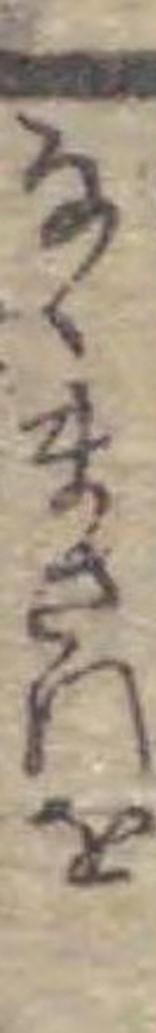なくまさ門を
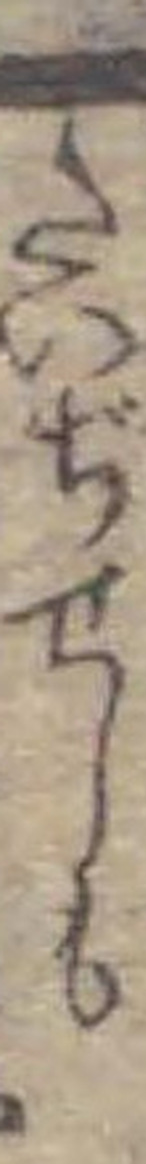たいぢせしも
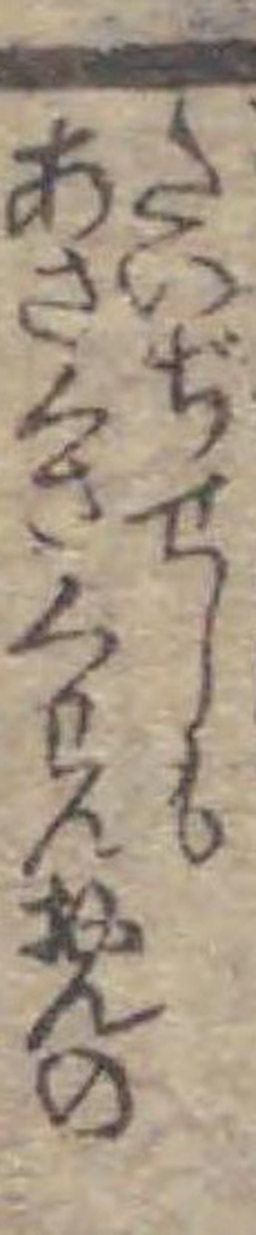あさくさくわんおんの
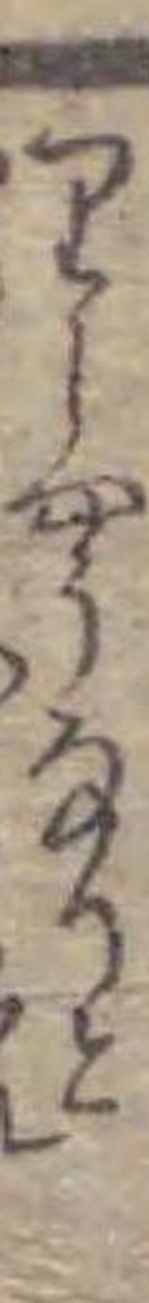りしやうなりと
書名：時代世話二挺皷 : 2巻
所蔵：国立国会図書館 National Diet Library, JAPAN
